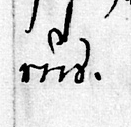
ef¬
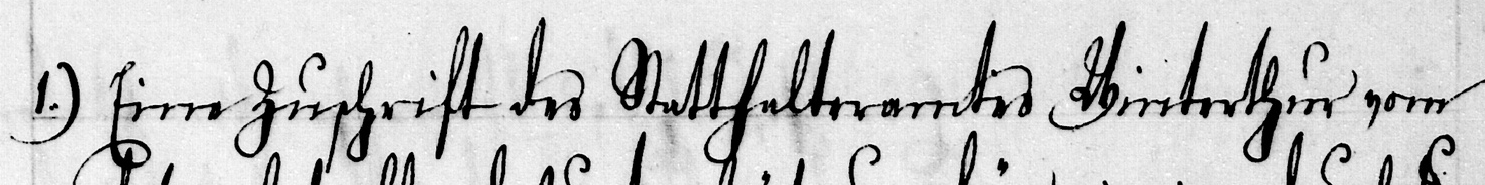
1.) Eine Zuschrift des Statthalteramtes Winterthur vom
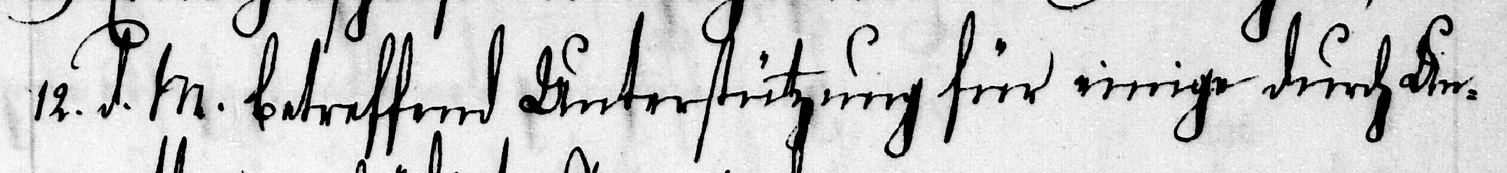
12. d. M. betreffend Unterstützung für einige durch Un¬
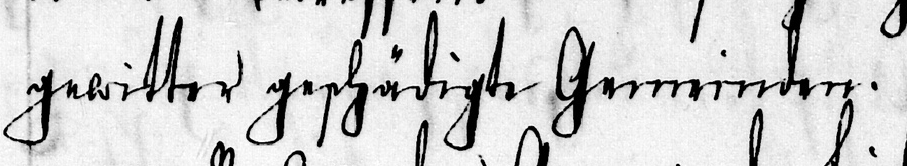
gewitter geschädigte Gemeinden.
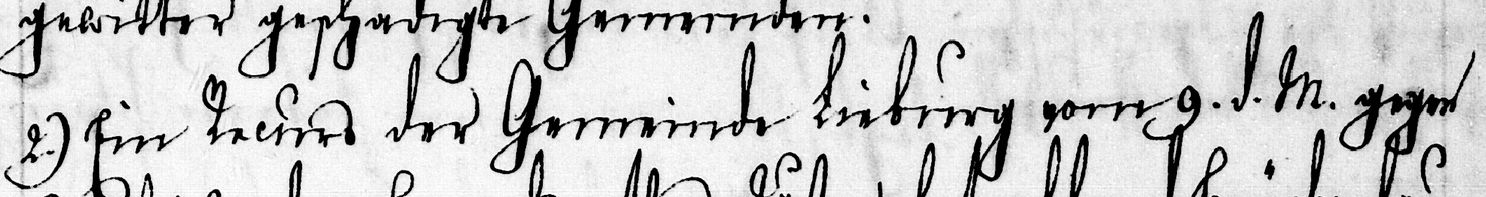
2.) Ein Recurs der Gemeinde Lieburg vom 9. d. M. gegen
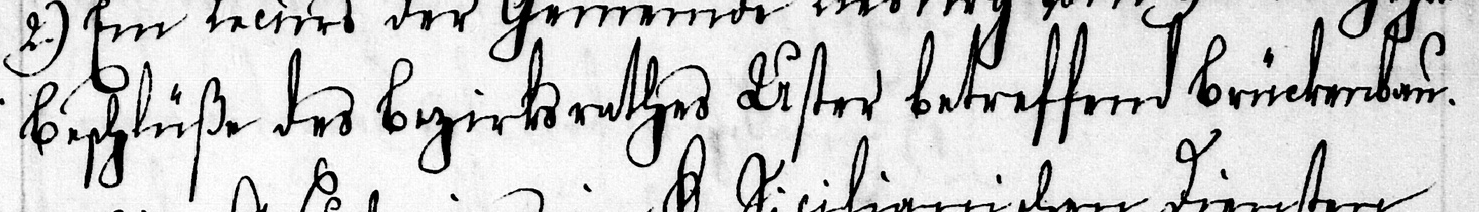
Beschlüße des Bezirksrathes Uster betreffend Brückenbau.
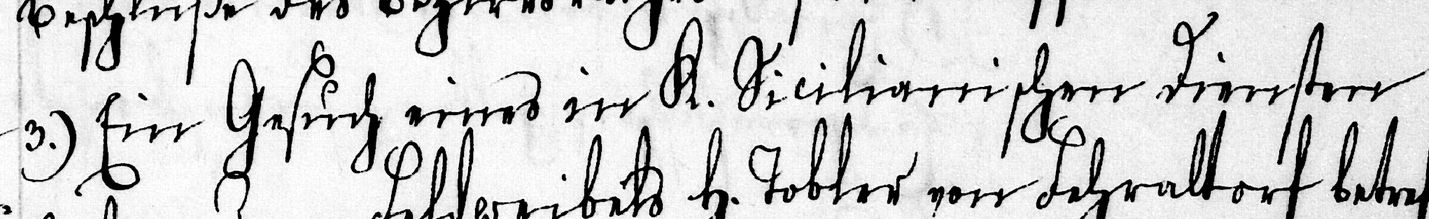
3.) Ein Gesuch eines in K. Sicilianischen Diensten
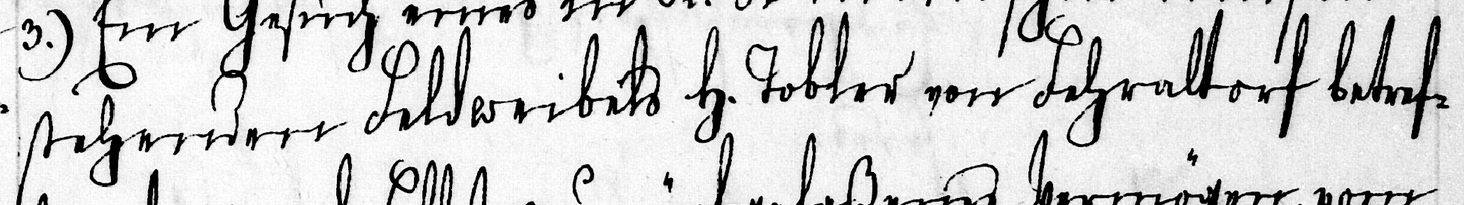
stehenden Feldweibels H. Tobler von Fehraltorf betr¬
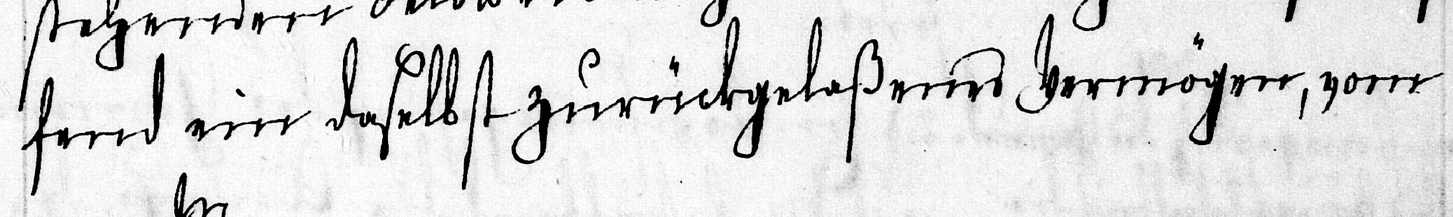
fend ein daselbst zurückgelaßenes Vermögen, vom
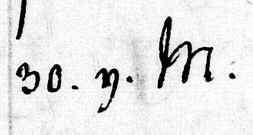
30. v. M.
